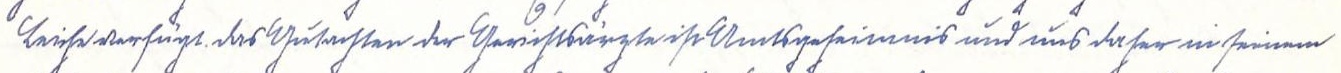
Leiche verfügt. Das Gutachten der Gerichtsärzte ist Amtsgeheimnis und uns daher in seinem
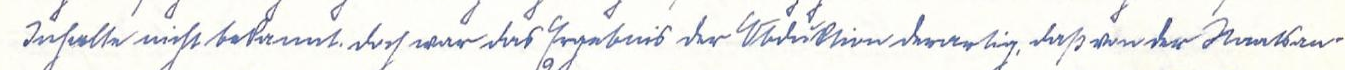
Inhalte nicht bekannt. Doch war das Ergebnis der Obduktion derartig, dass von der Staatsan-
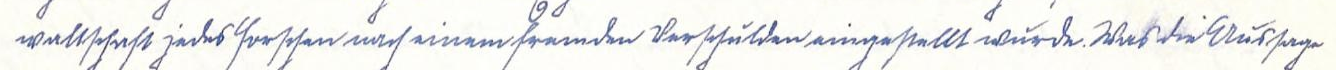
waltschaft jedes Forschen nach einem fremden Verschulden eingestellt wurde. Was die Aussage
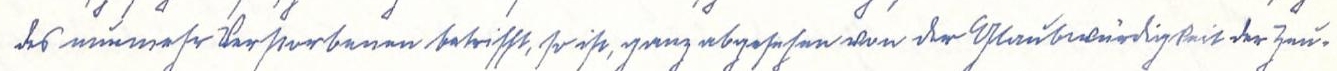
des nunmehr Verstorbenen betrifft, so ist, ganz abgesehen von der Glaubwürdigkeit der Zeu-
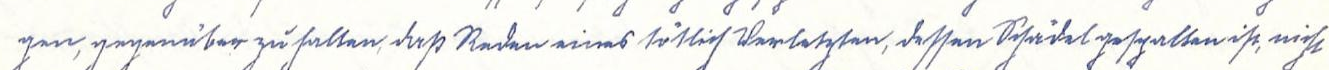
gen, gegenüber zu halten, das Reden eines tötlich Verletzten, dessen Schädel gespalten ist, nicht
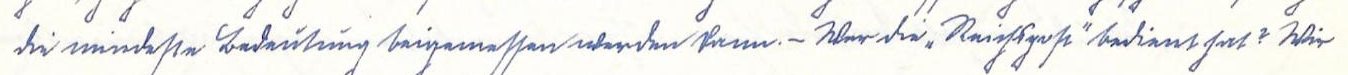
die mindeste Bedeutung beigemessen werden kann. Wer die „Reichspost“ bedient hat? Wir
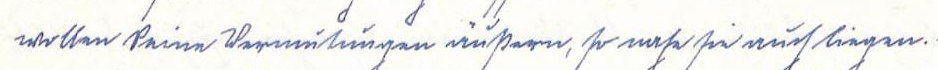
wollen keine Vermutungen äußern, so nahe sie auch liegen.
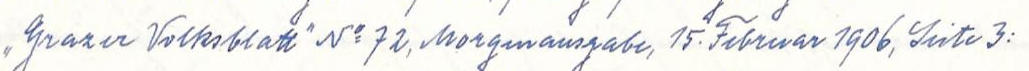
„Grazer Volksblatt“ Nummer 72, Morgenausgabe, 15. Februar 1906, Seite 3:
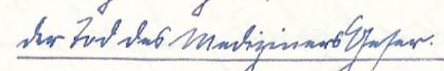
Der Tod des Mediziners Geser
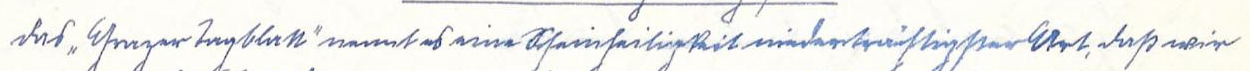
Das „Grazer Tagblatt“ nennt es eine Scheinheiligkeit niederträchtigster Art, daß wir
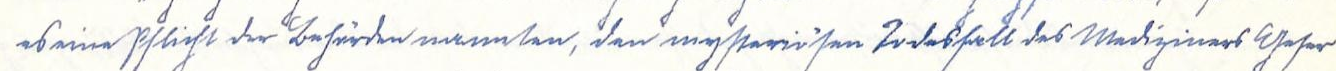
es eine Pflicht der Behörde nannten, den mysteriösen Todesfall des Mediziners Geser
